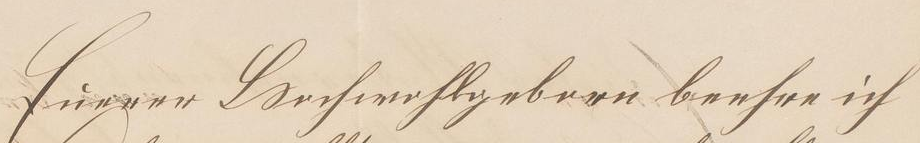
Euerer Hochwohlgeborn beehre ich
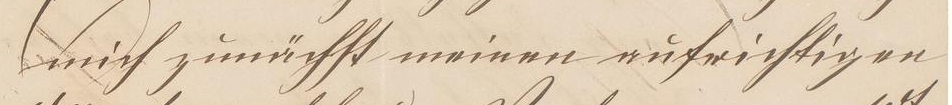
mich zunächst meinen aufrichtigen
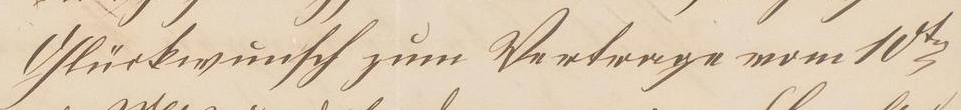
Glückwunsch zum Vertrage vom 10ten
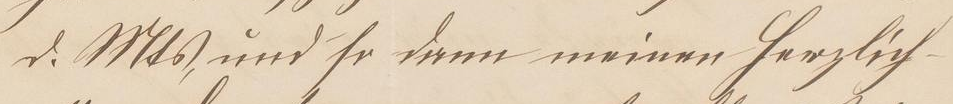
d. Mts, und so dann meinen herzlich-
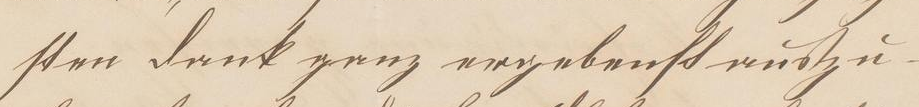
sten Dank ganz ergebenst auszu-
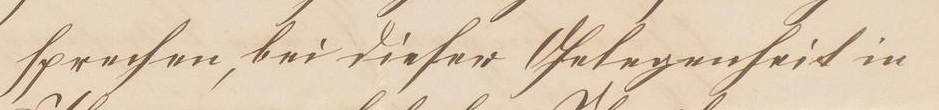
sprechen, bei dieser Gelegenheit in
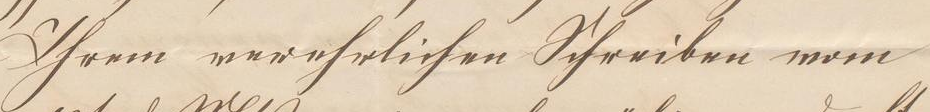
Ihrem verehrlichen Schreiben vom
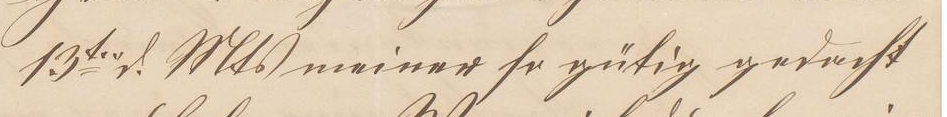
13ten d. Mts meiner so gütig gedacht
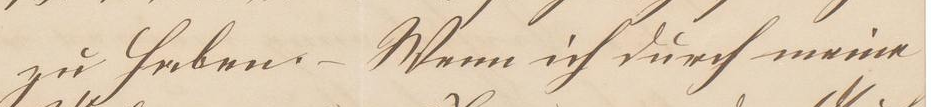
zu haben. – Wenn ich durch meine
